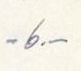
6
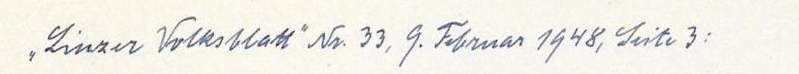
„ Linzer Volksblatt“, Nr. 33. 9. Februar 1948, Seite 3:
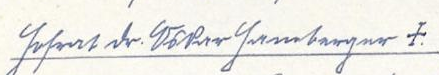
Hofrat Dr. Oskar Hamberger +
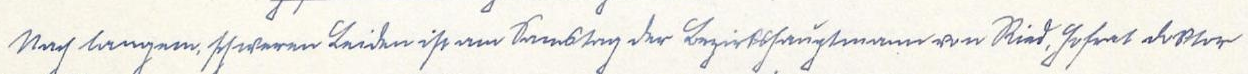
Nach langem, schweren Leiden ist am Samstag der Bezirkshauptmann von Ried, Hofrat Doktor
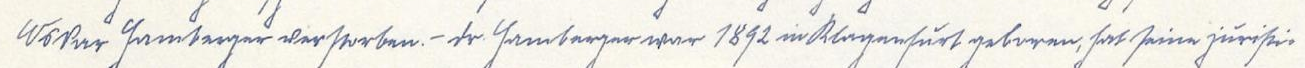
Oskar Handwerker verstorben. - Dr. Hamberger war 1892 in Klagenfurt geboren, hat seine juristi
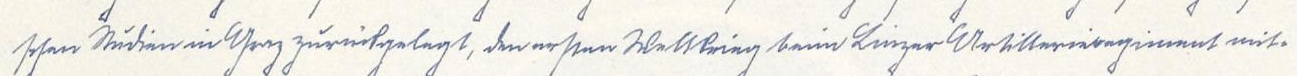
schen Studien in Graz zurückgelegt, den ersten Weltkrieg beim Linzer Artillerieregiment mit-
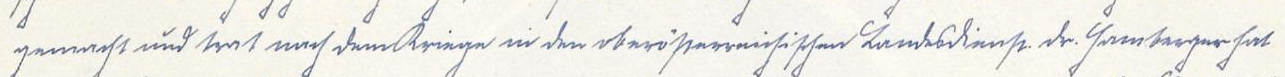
gemacht und trat nach dem Kriege in den oberösterreichischen Landesdienst. Dr. Hamberger hat
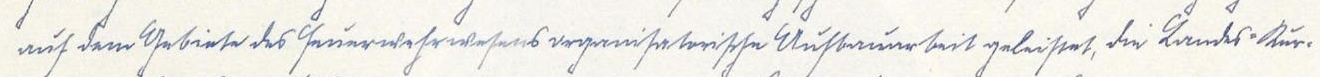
auf dem Gebiete des Feuerwehrwesens organisatorische Aufbauarbeit geleistet, die Landes-Kur-
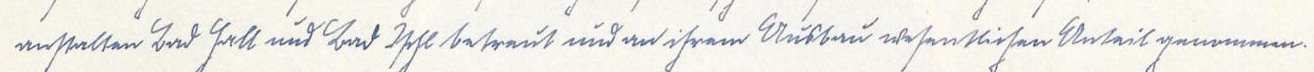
anstalten Bad Hall und Bad Ischl betreut und an ihrem Aufbau wesentlichen Anteil genommen.
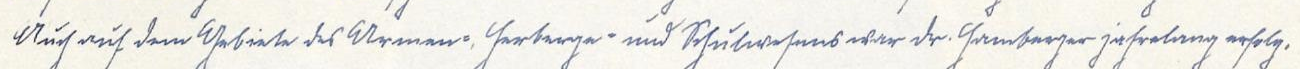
Auch auf dem Gebiete des Armen-, Herberge- und Schulwesens war Dr. Hamberger jahrelang erfolg-
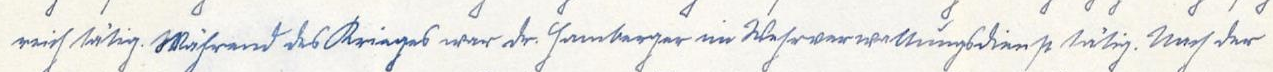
reich tätig. Während des Krieges war Dr. Hamberger im Wehrverwaltungsdienste tätig. Nach der
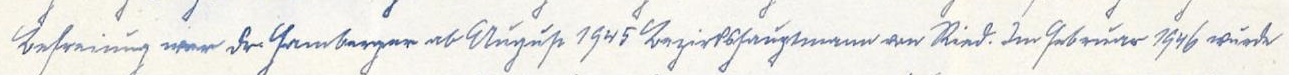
Befreiung war Dr. Hamberger ab August 1945 Bezirkshauptmann von Ried. Im Februar 1946 wurde
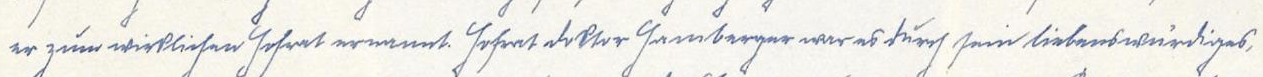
er zum wirklichen Hofrat ernannt. Hofrat Doktor Hamberger war es durch sein liebenswürdiges,
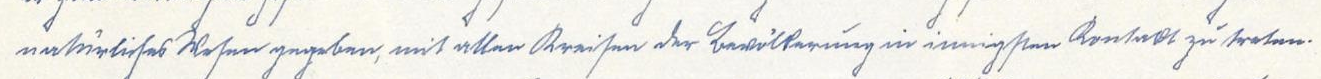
natürliches Wesen gegeben, mit allen Kreisen der Bevölkerung in innigsten Kontakt zu treten.
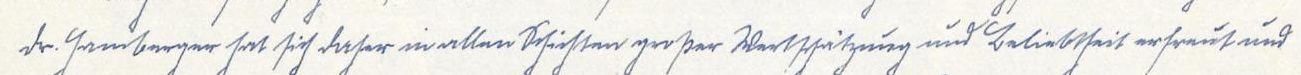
Dr. Hamberger hat sich daher in allen Schichten großer Wertschätzung und Beliebtheit erfreut. und
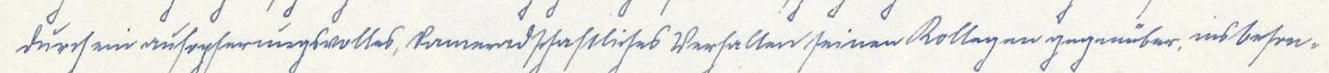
durch ein aufopferungsvolles, kameradschaftliches verhalten seinen Kollegen gegenüber, insbeson-
